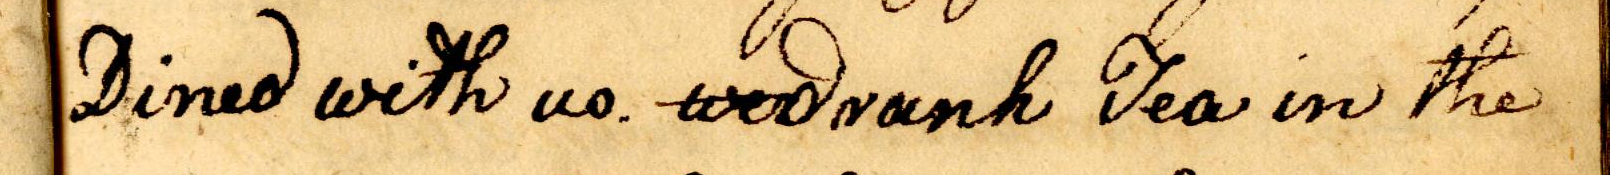Dined with us. [we] drank Tea in the
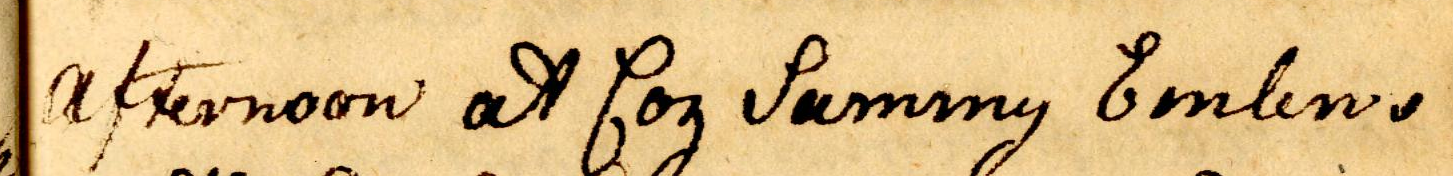Afternoon at Coz Sammy Emlens
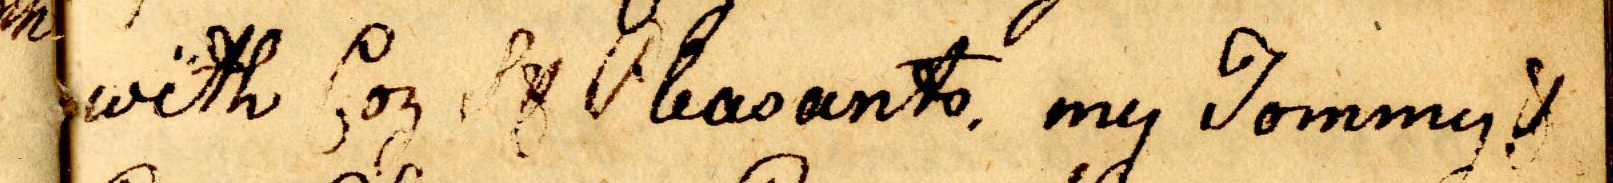with Coz S& Pleasants. my Tommy &
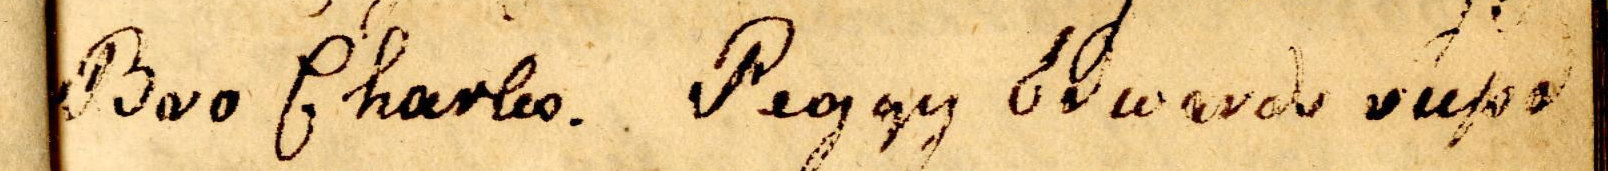Bro Charles. Peggy Edwards supd
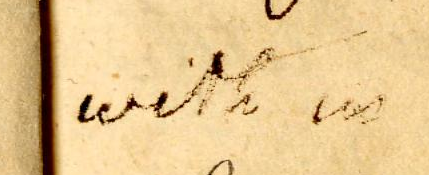with us
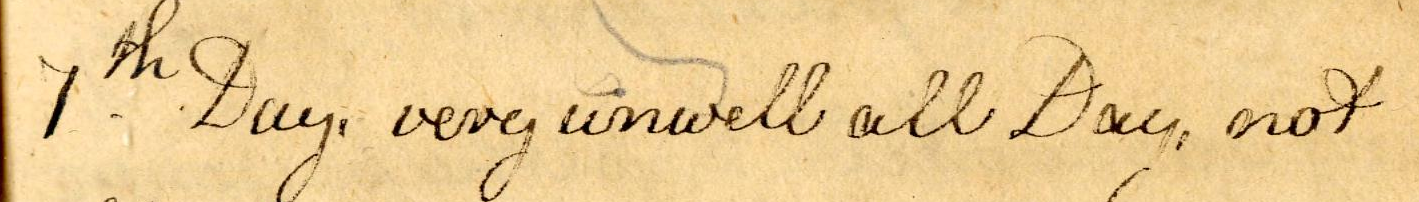7^th. Day, very unwell all Day, not
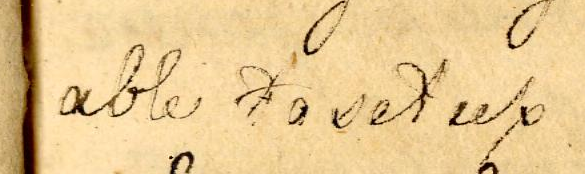able to set up
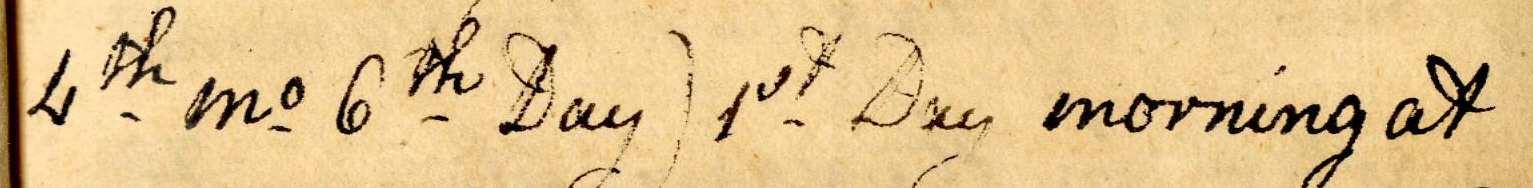4^th m^o 6^th Day ) 1^st Day morning at
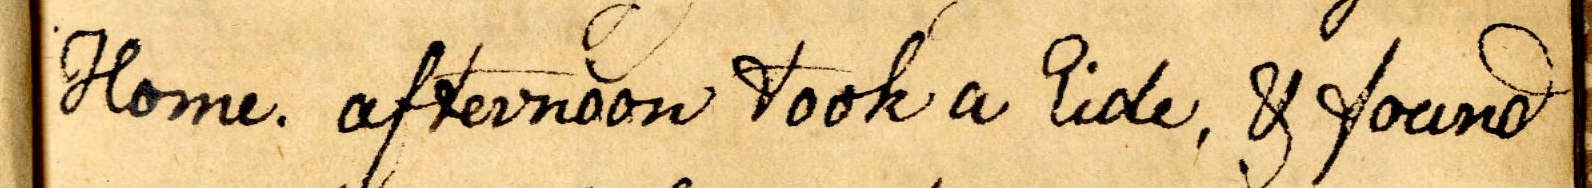Home. afternoon took a ride, & found
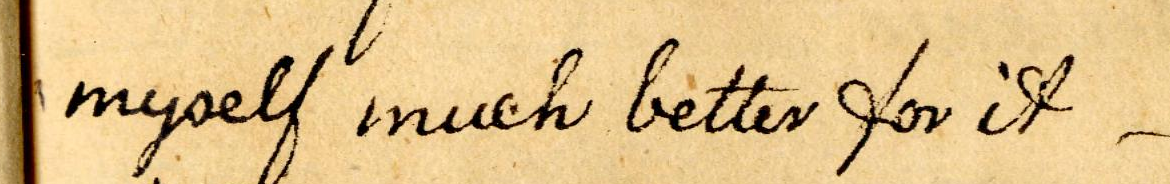myself much better for it-
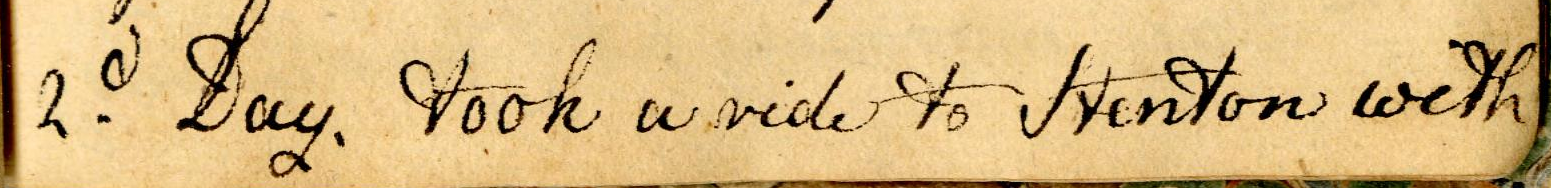2^d Day. took a ride to Stenton with
